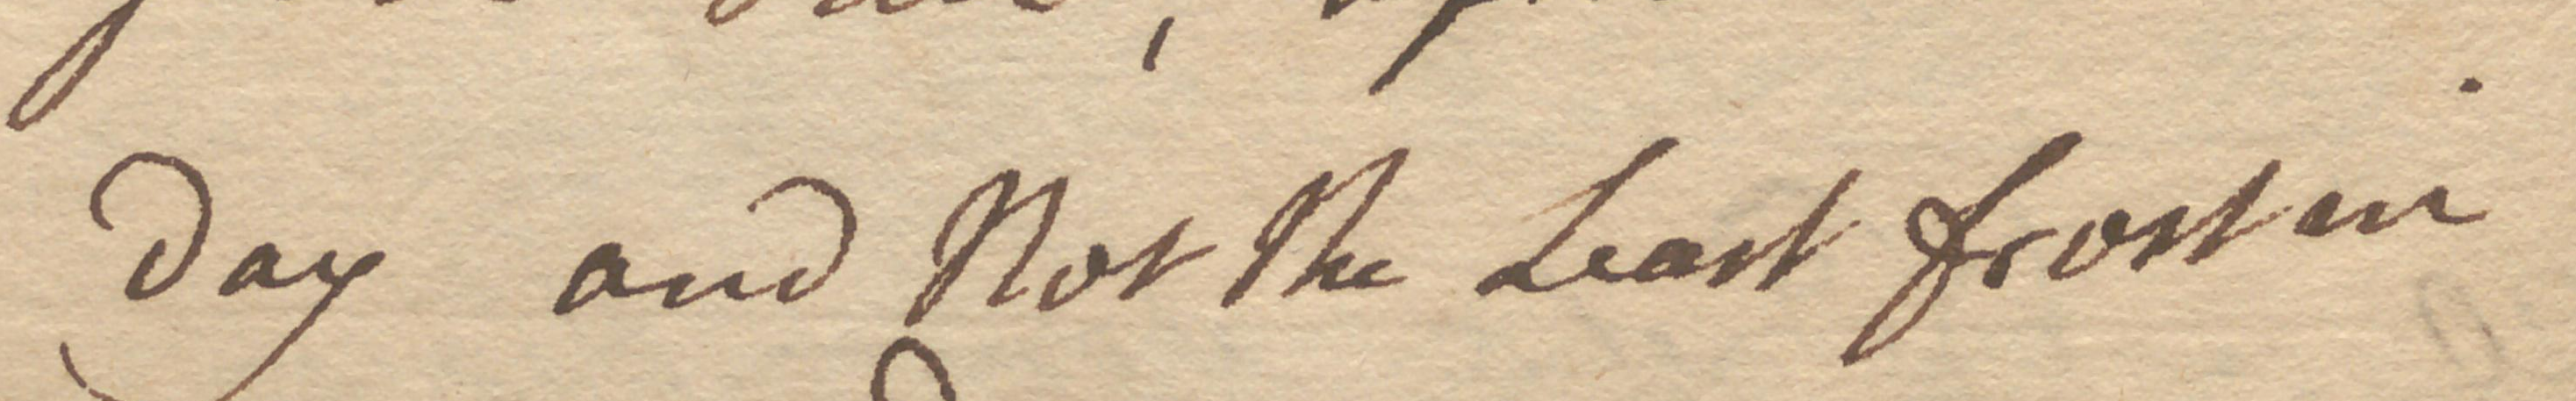day and Not the Least frost in
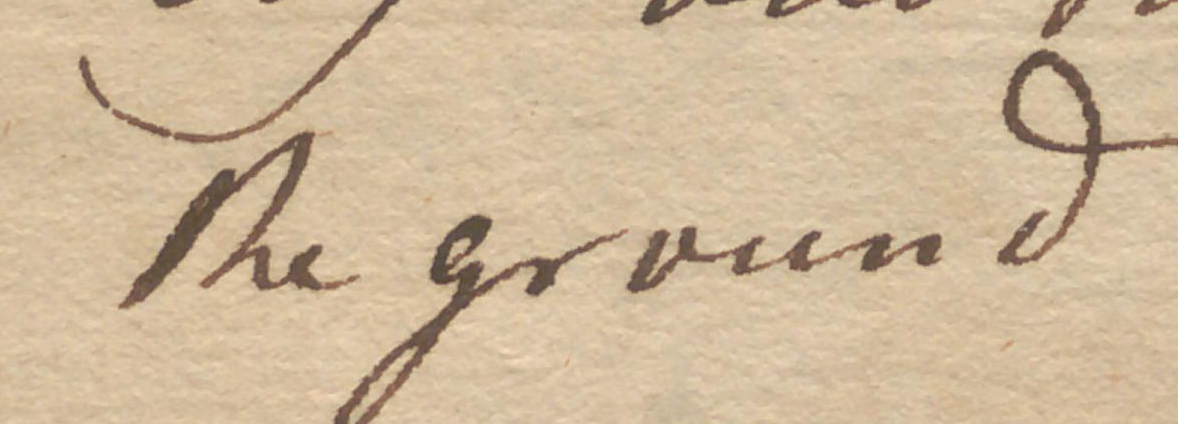the ground
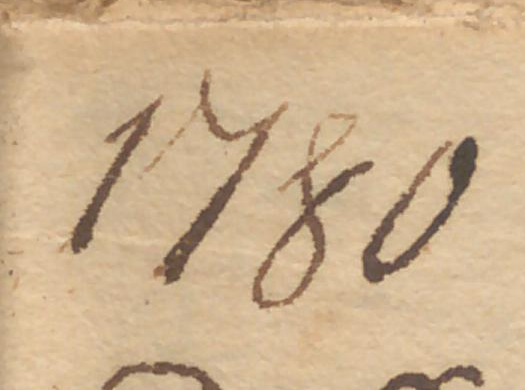1780
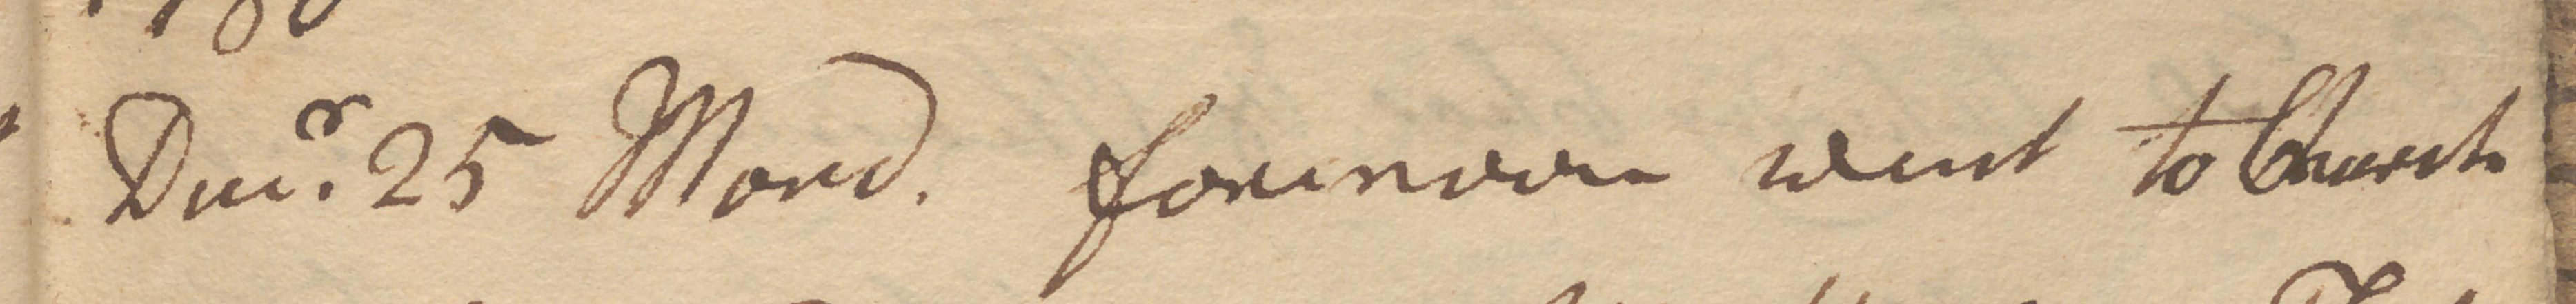Dec^r. 25 Mond. forenoon went to Church
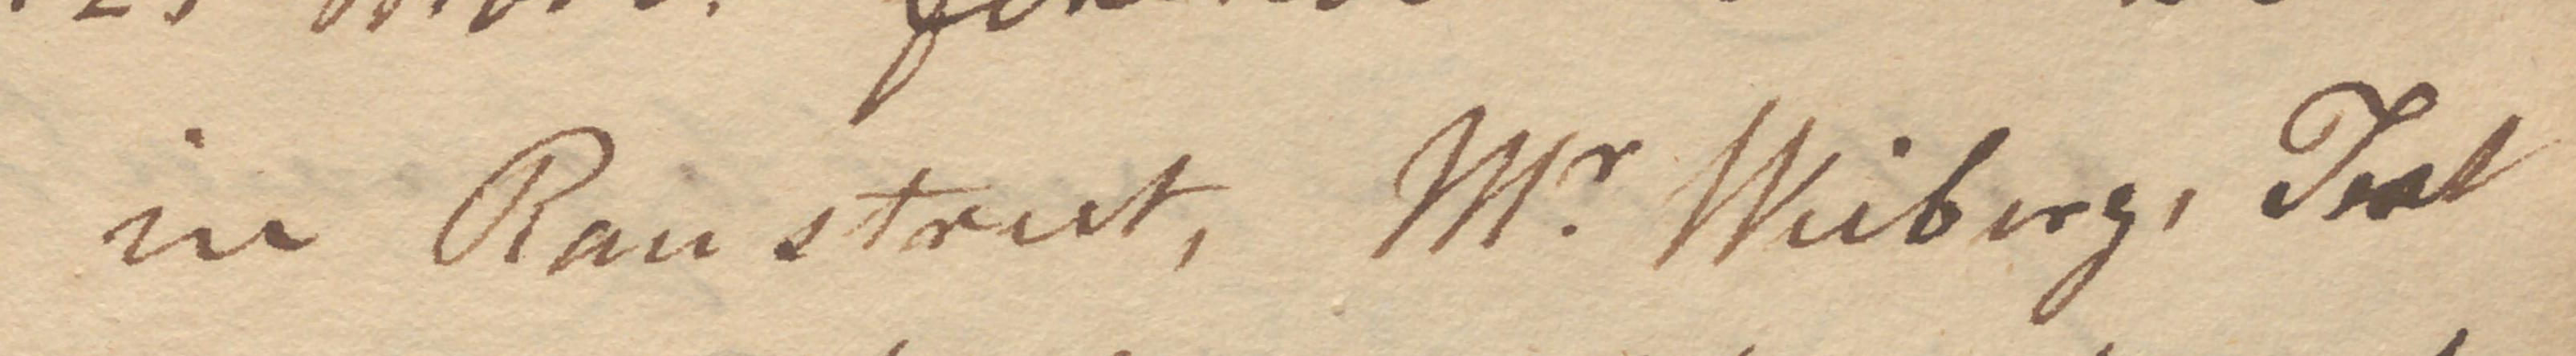in Race street, M^r. Weibergs Teal
